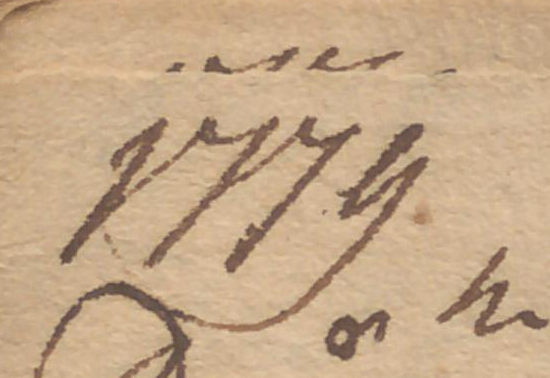1779
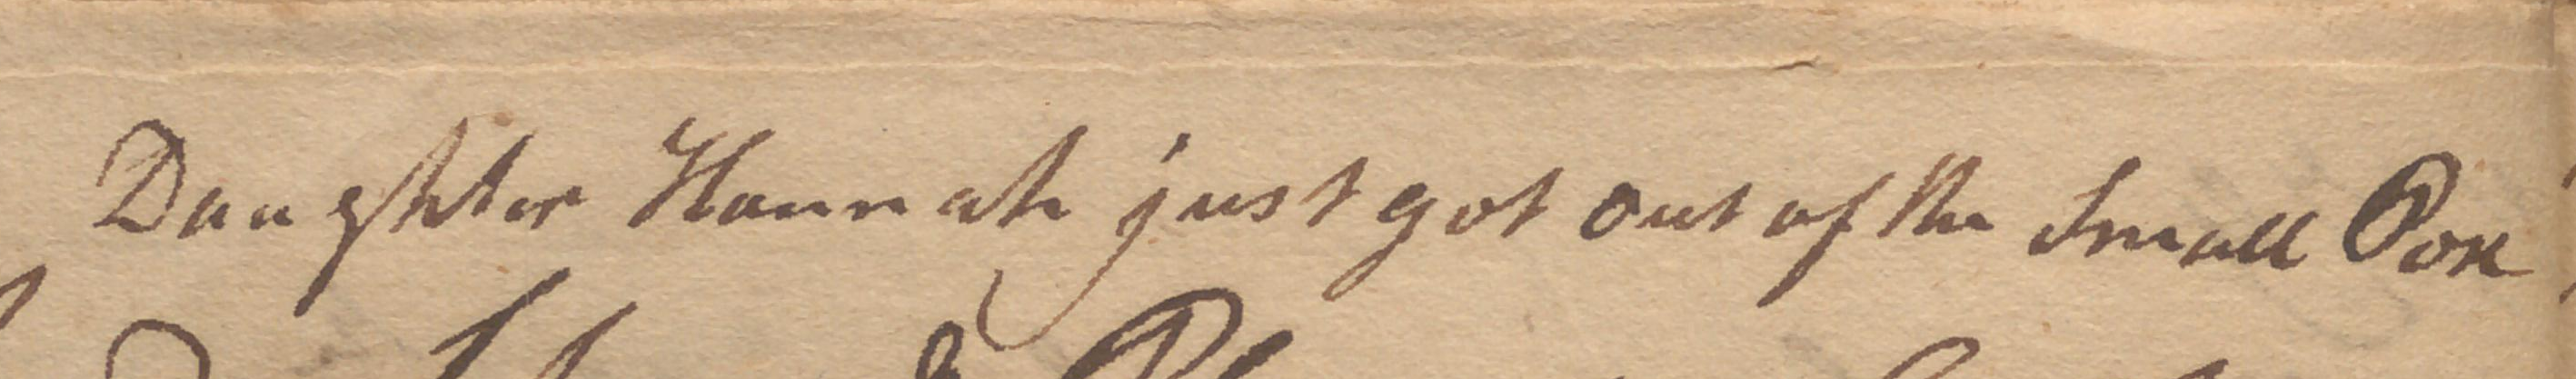Daughter Hannah just got out of the small Pox
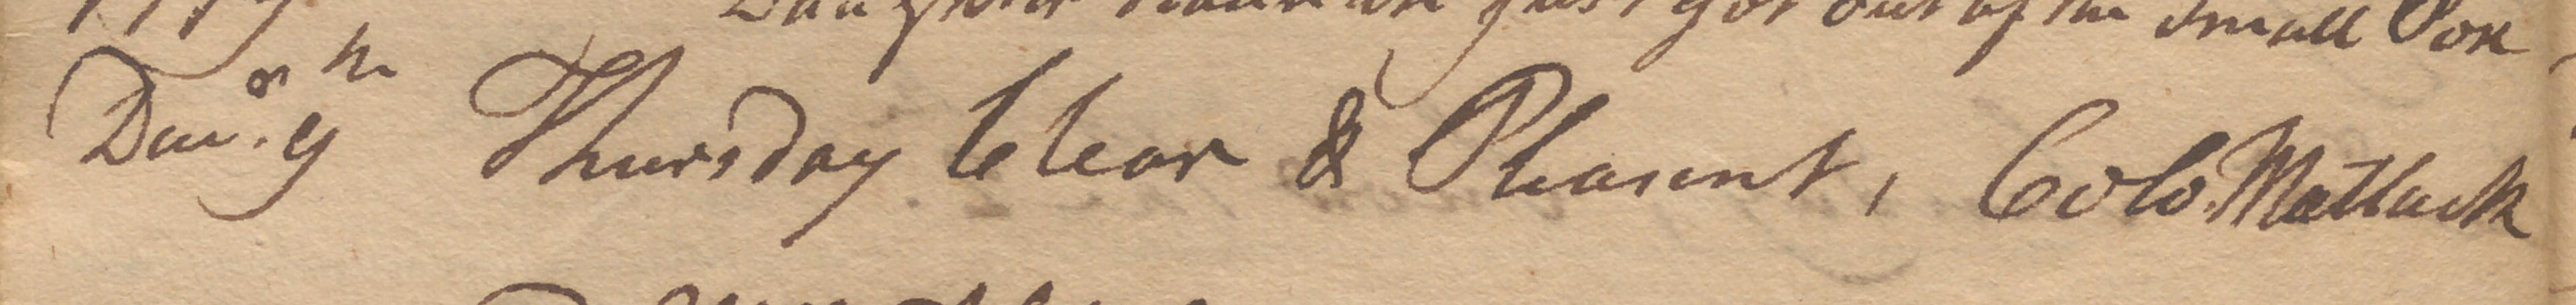Dec^r. 9^th Thursday Clear & Pleasent, Colo. Matlack
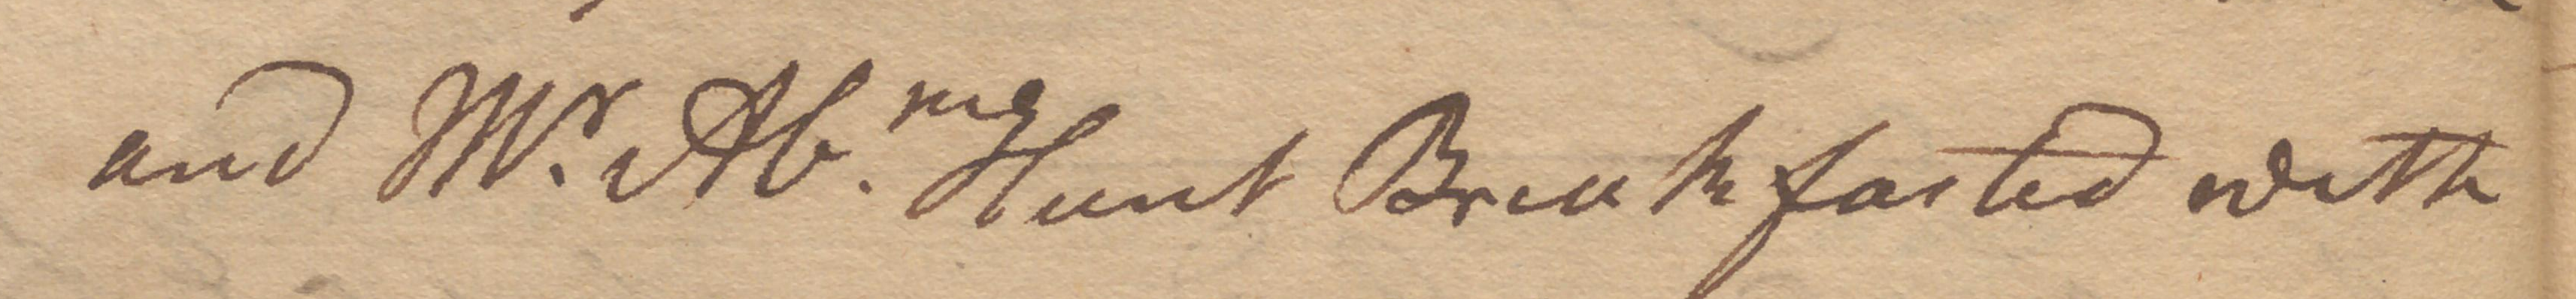and M^r. Ab^m. Hunt Breakfasted with
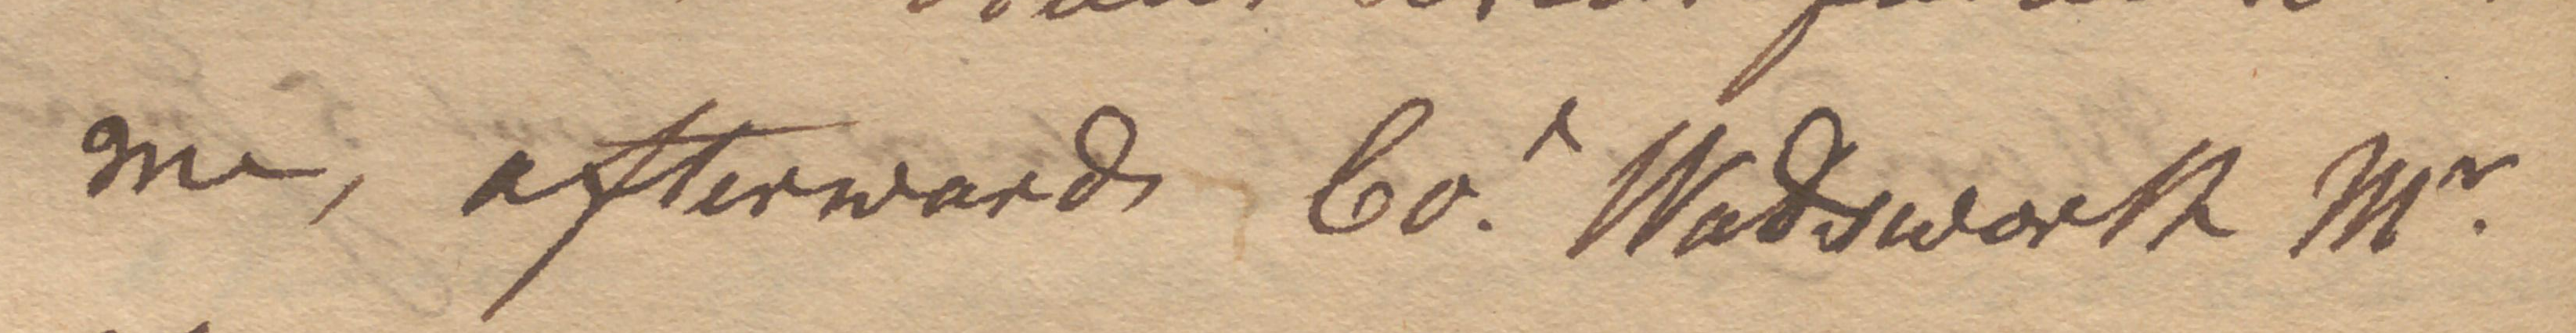me, afterwards Co^l. Wadsworth M^r.
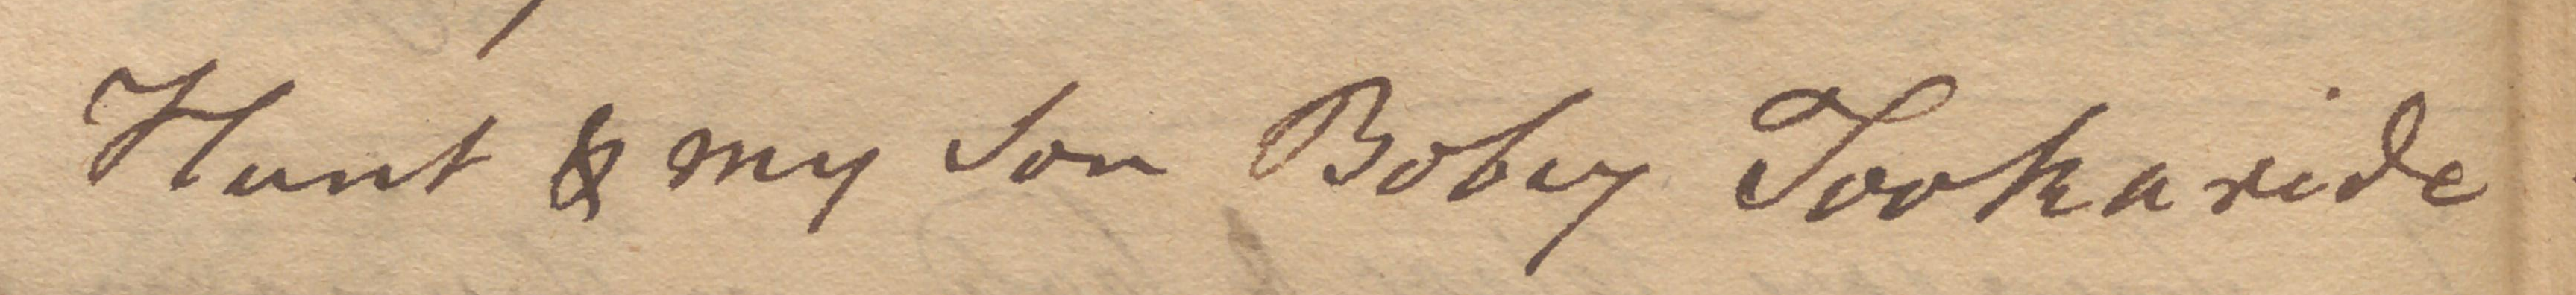Hunt & my son Bobey Took a ride
